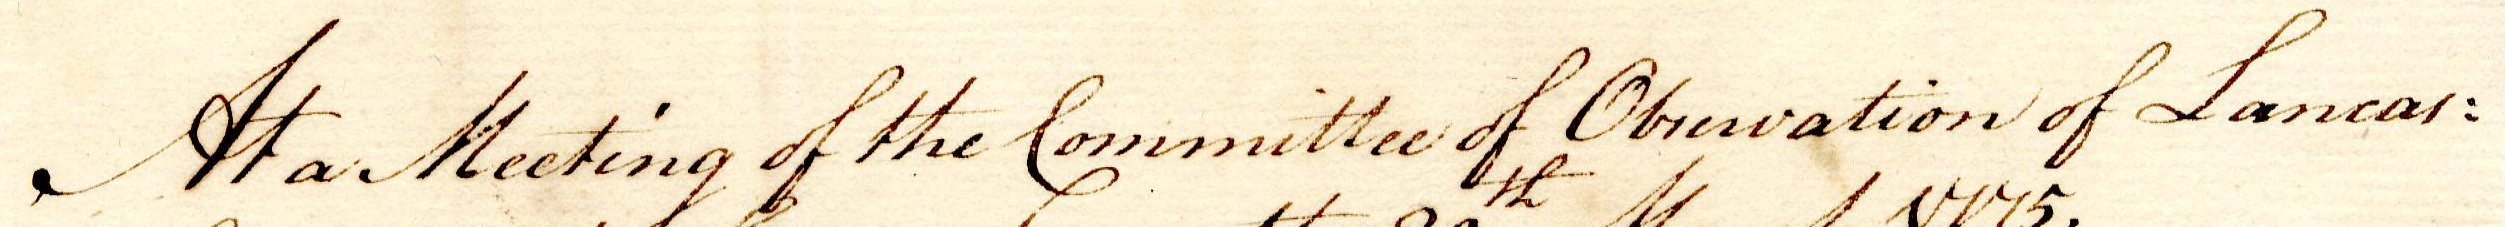At a Meeting of the Committee of Observation of Lancas-
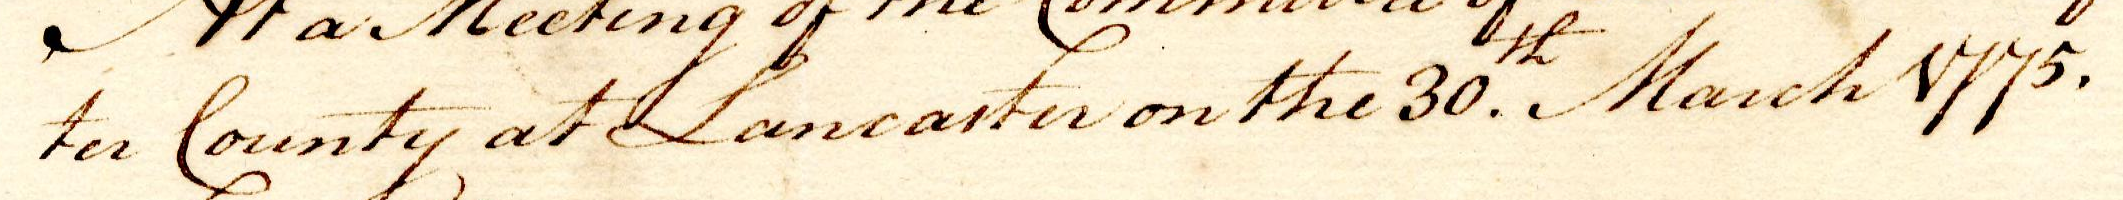-ter County at Lancaster on the 30^th. March 1775.
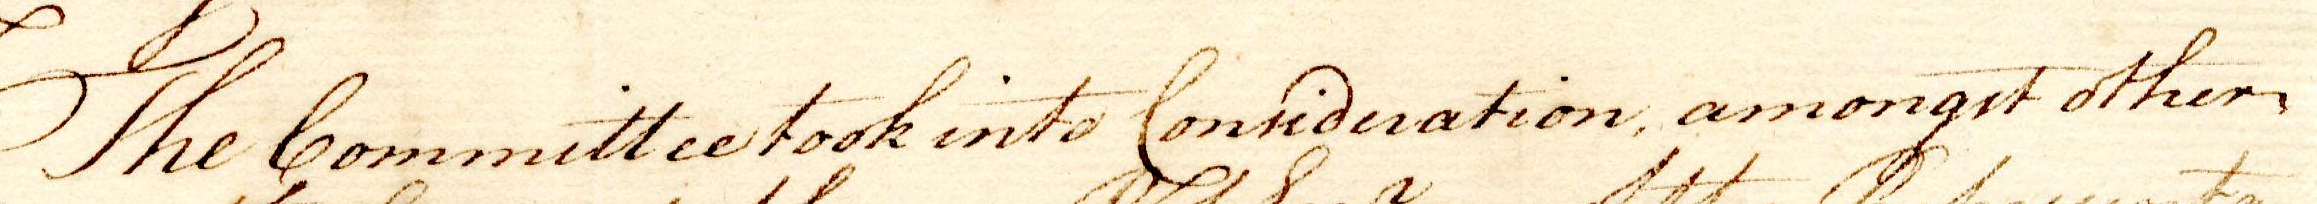The Committee took into Consideration, amongst other
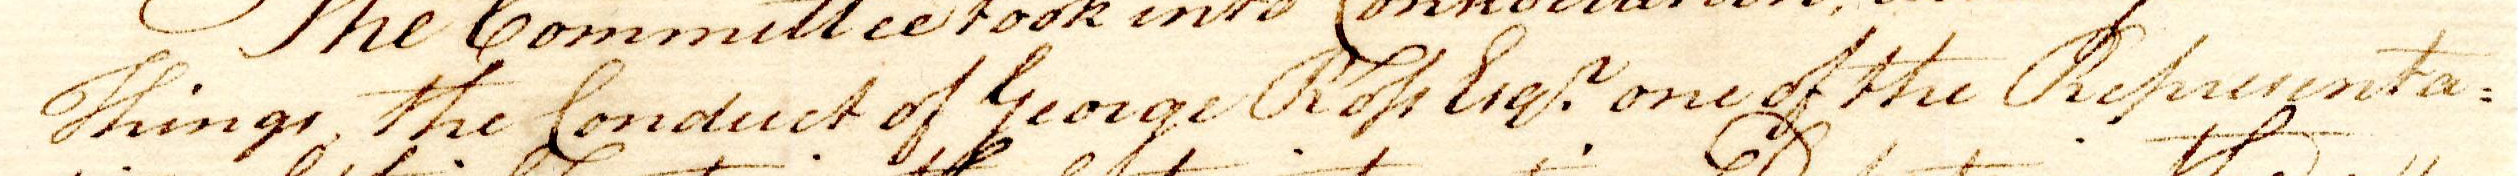Things, the Conduct of George Ross Esq^r. one of the Representa-
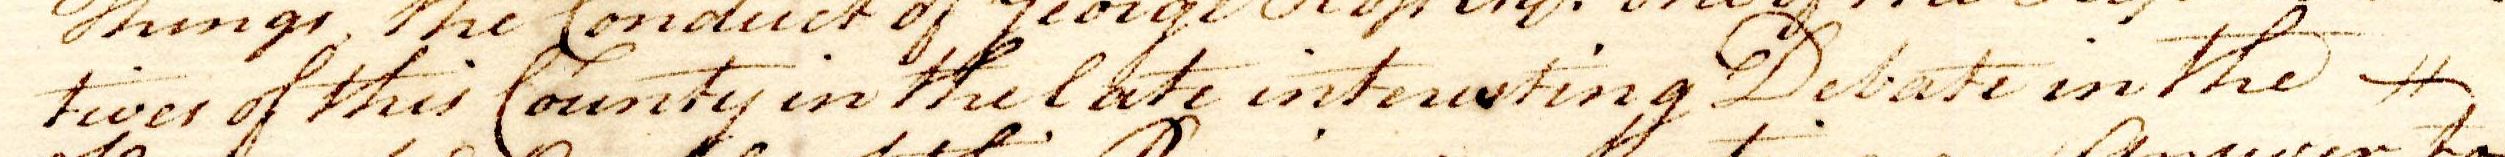-tives of this County in the late interesting Debate in the
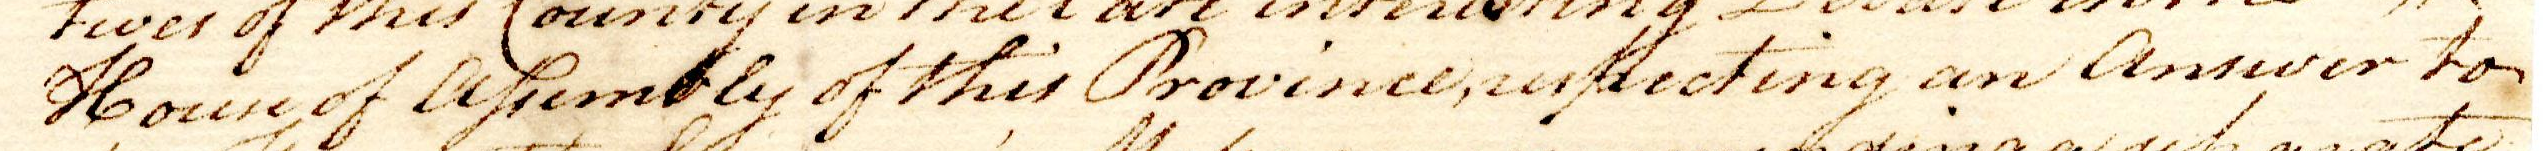House of Assembly of this Province, respecting an Answer to
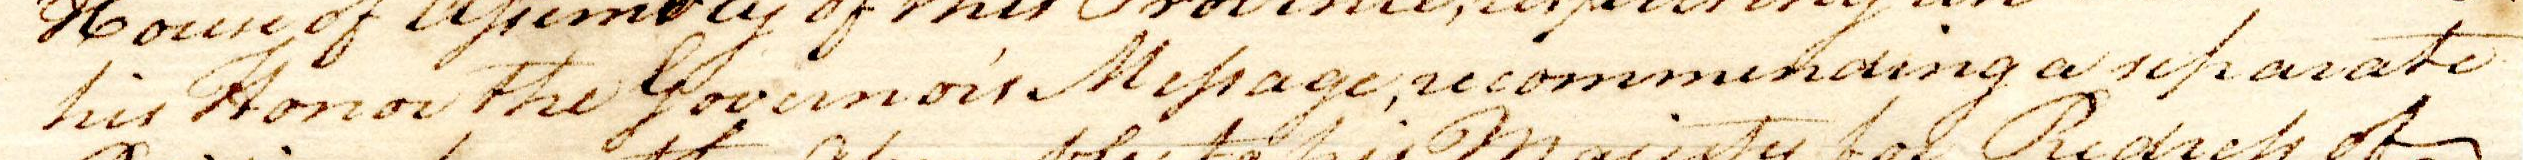his Honor the Governors Message, recommending a separate
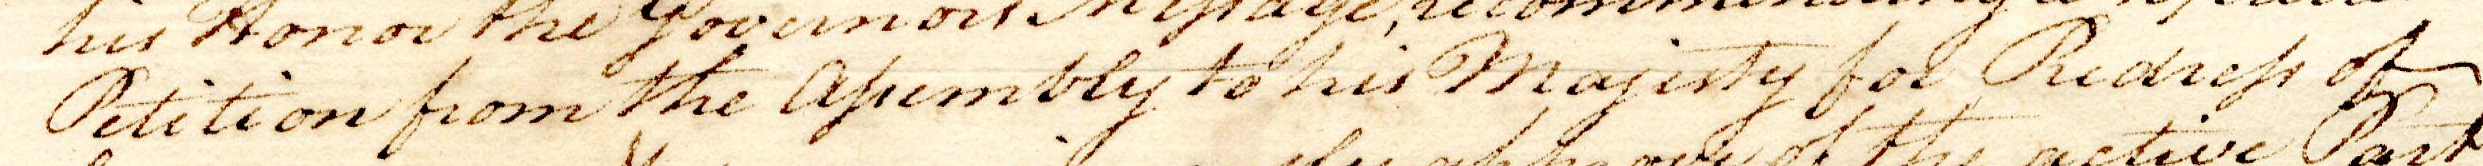Petition from the Assembly to his Majesty for Redress of
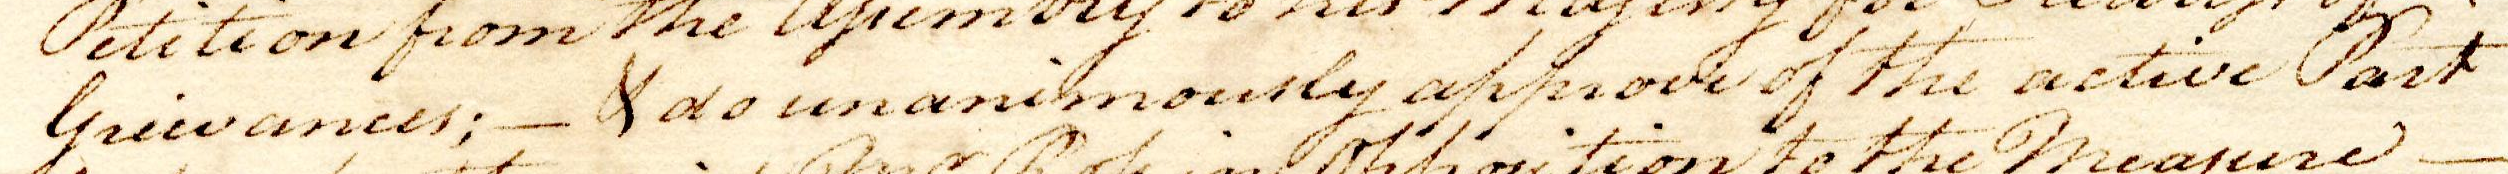Grievances;- & do unanimously approve of the active Part
